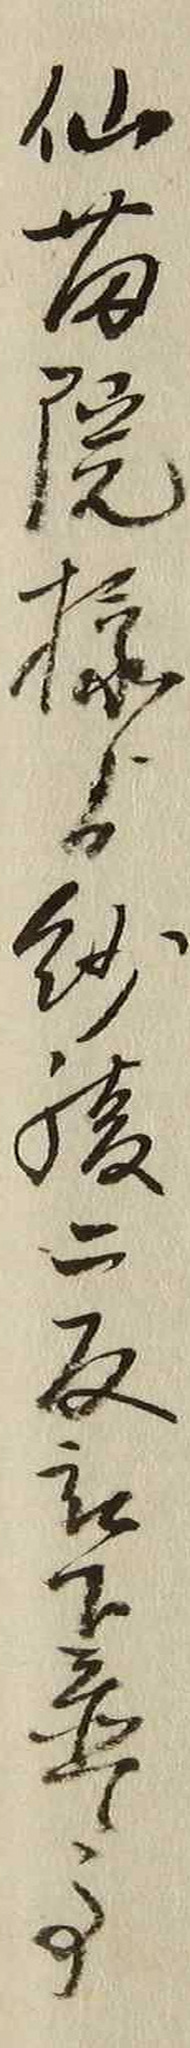仙苗院様ゟ紗綾二反被下置候事
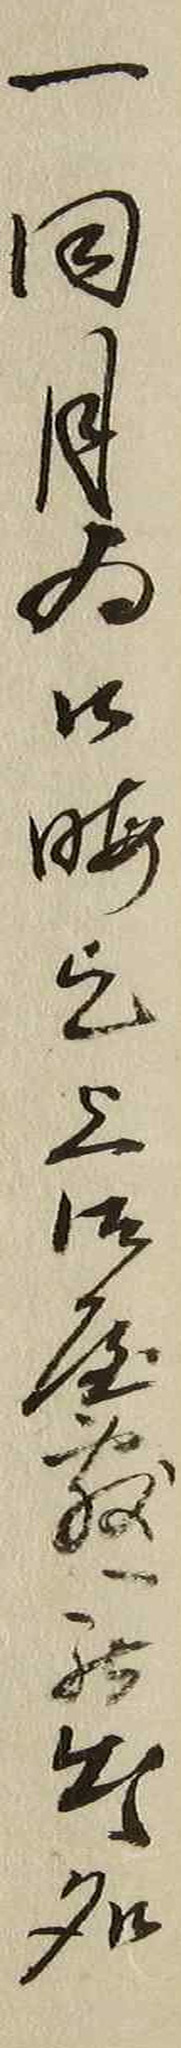一同月為御暇乞上御屋敷へ罷出候処
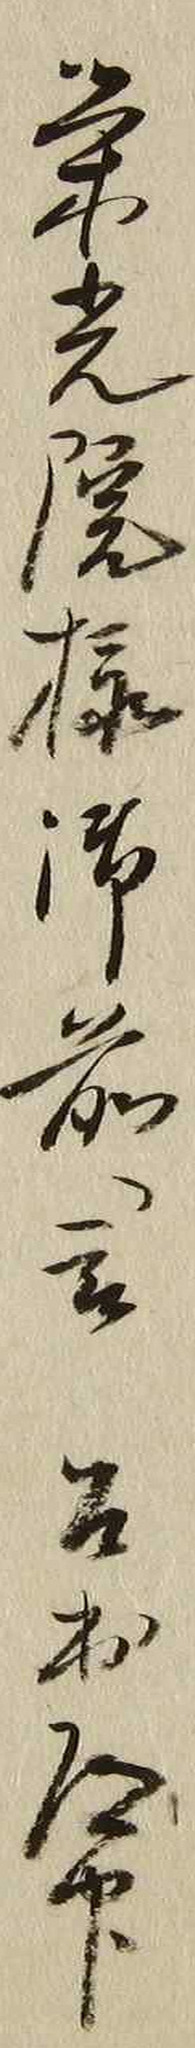栄光院様御前へ被召出道中
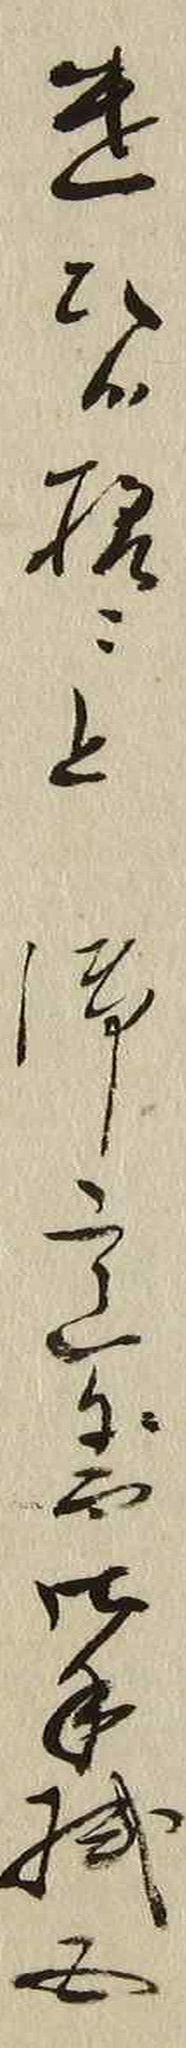遣ひ候様ニと御意上に而御手拭五
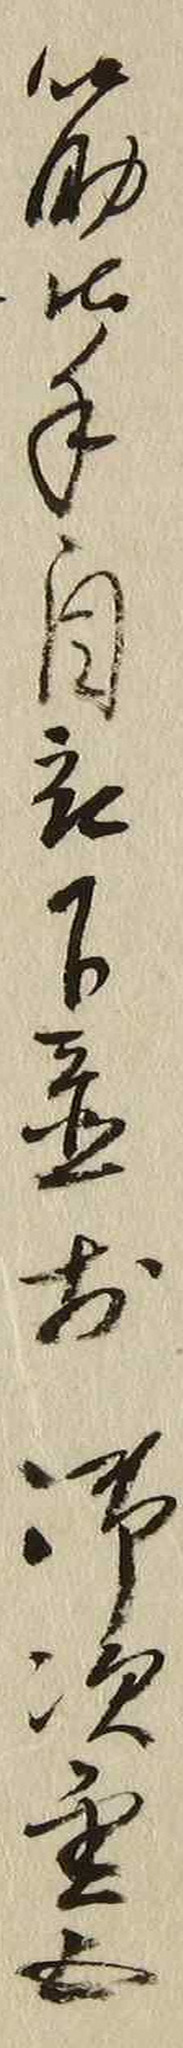筋御手自被下置於御次金五
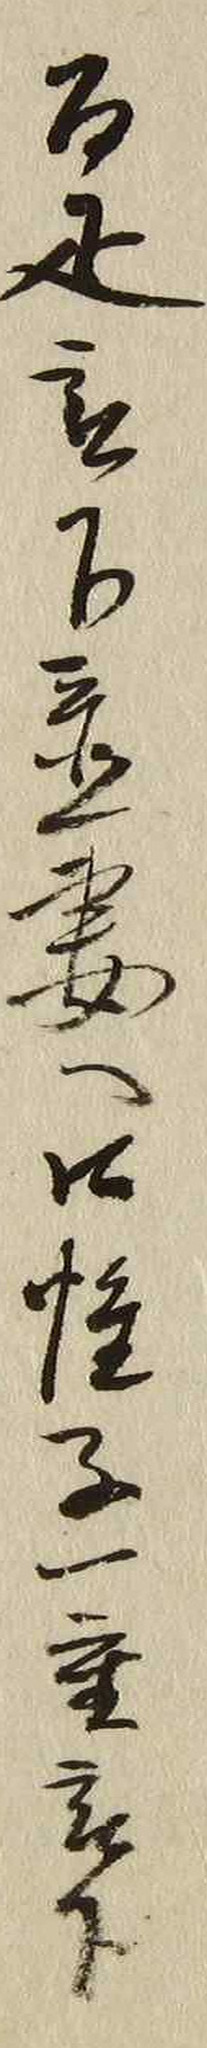百疋被下置妻へ御帷子一重被下
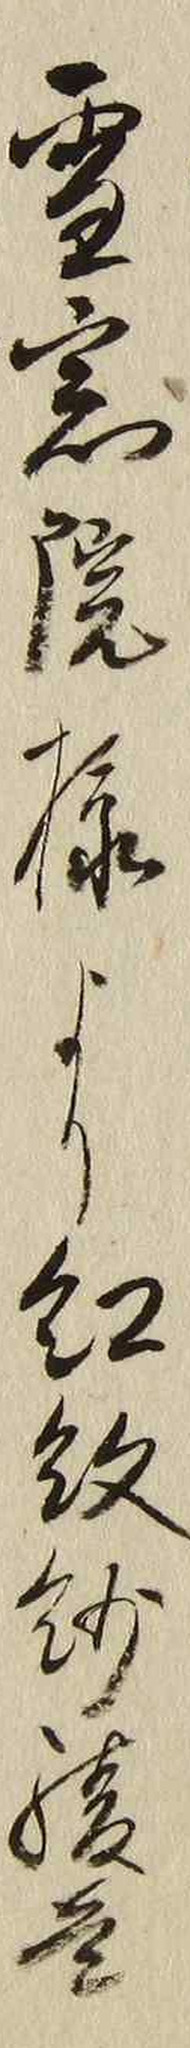雪窓院様より紅紋紗綾壱
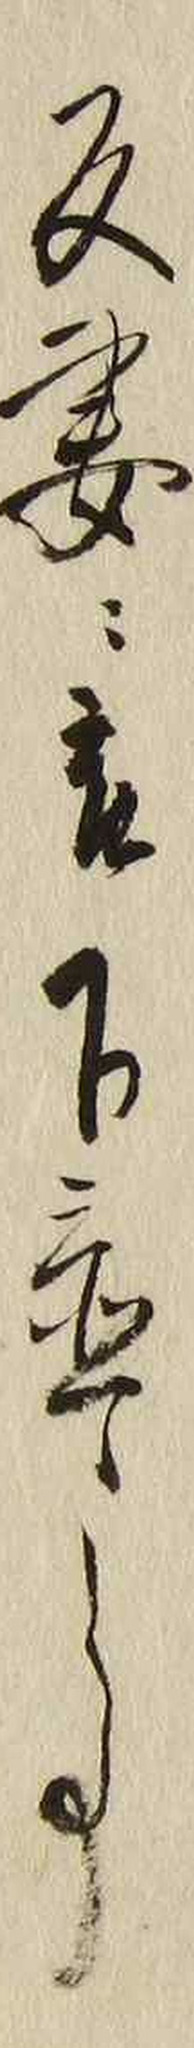反妻ニ被下置候事
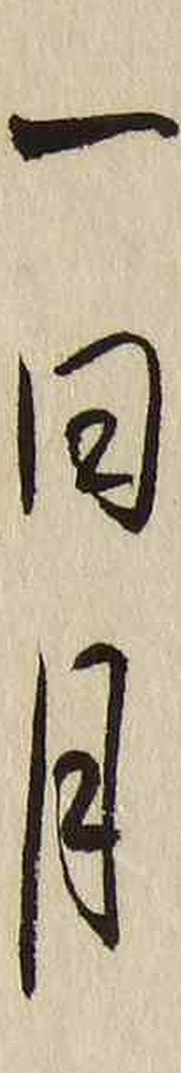一同月

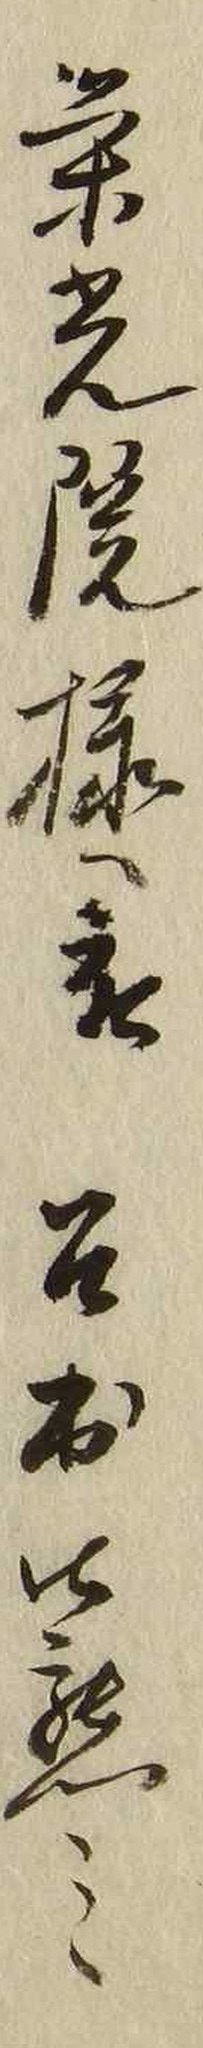栄光院様へ被召出御懇之
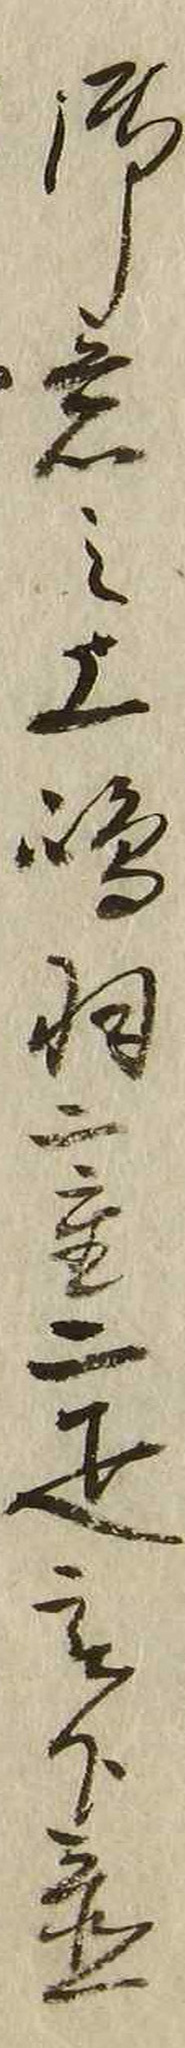御意之上島羽二重二疋被下置
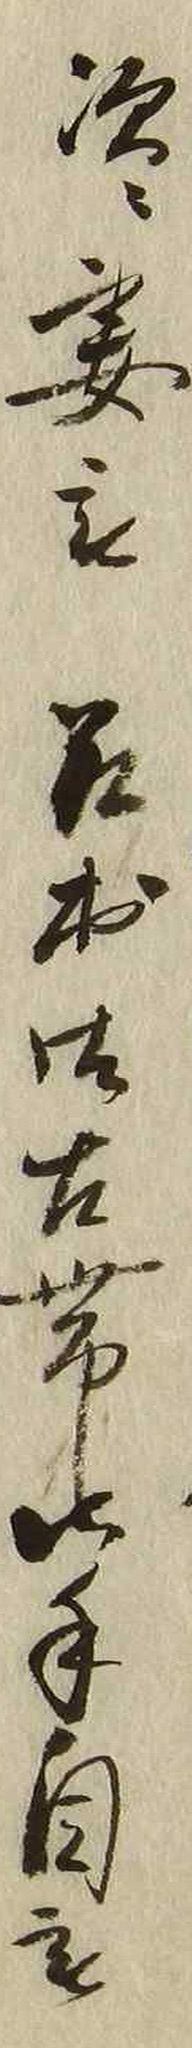次ニ妻被召出御古帯御手自被
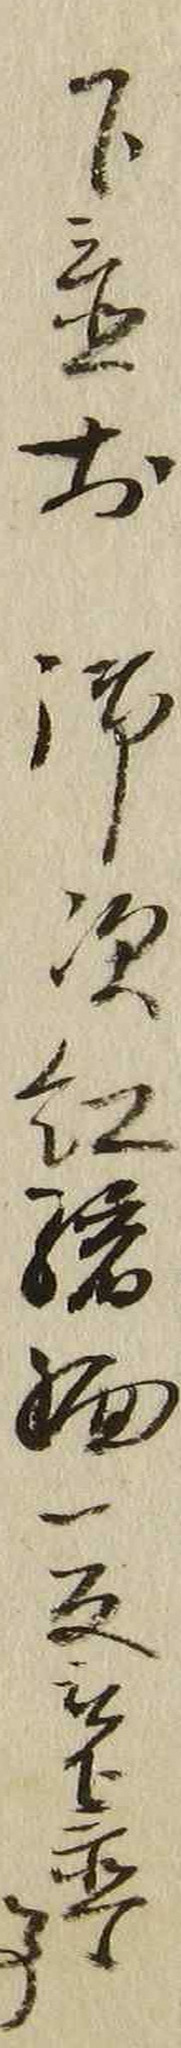下置於御次紅縮緬一反被下置候事
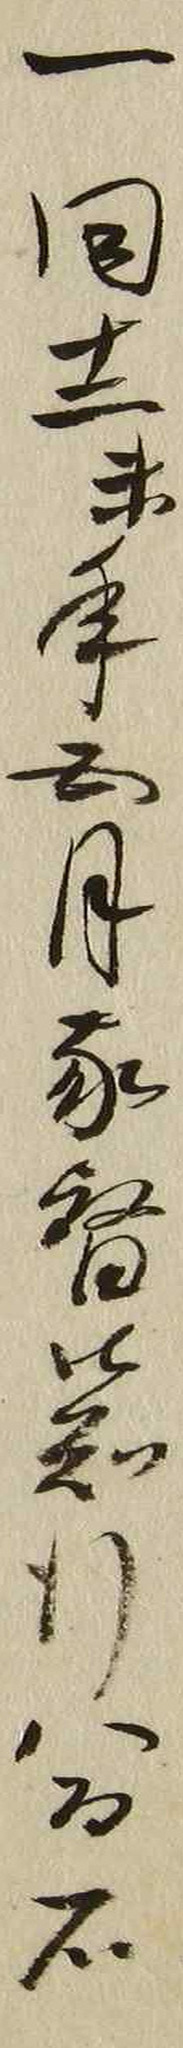一同十二未年五月家督御知行八百石
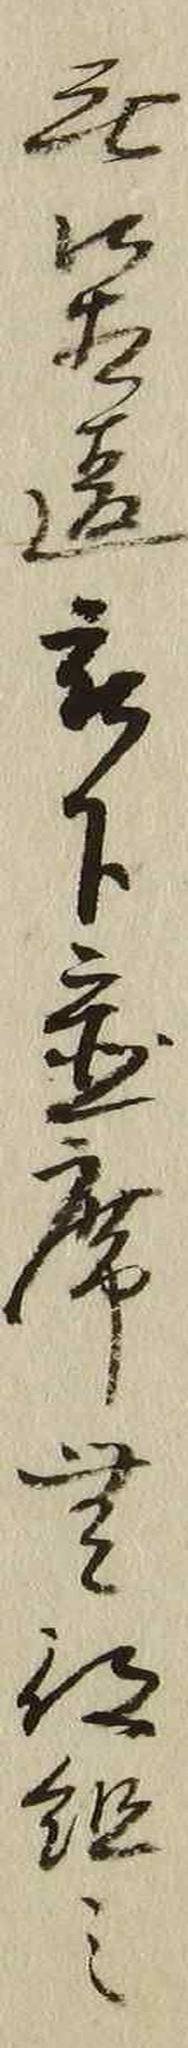無御相違被下置席無役組之
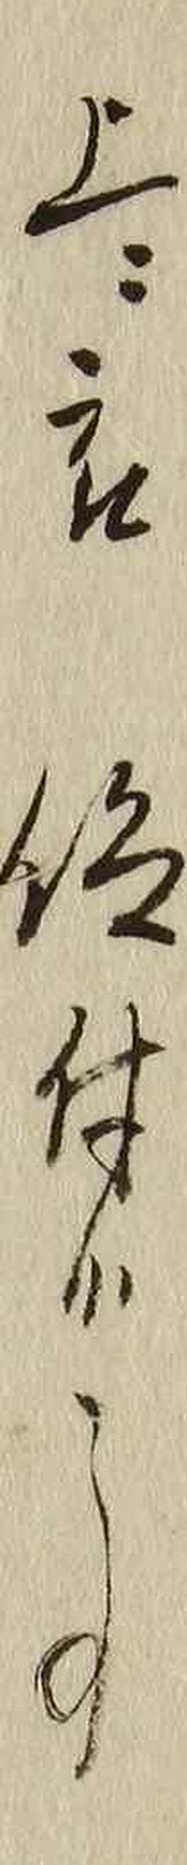上ニ被仰付候事
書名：諸士系譜　巻之351　す之部1
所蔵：会津若松市立会津図書館
